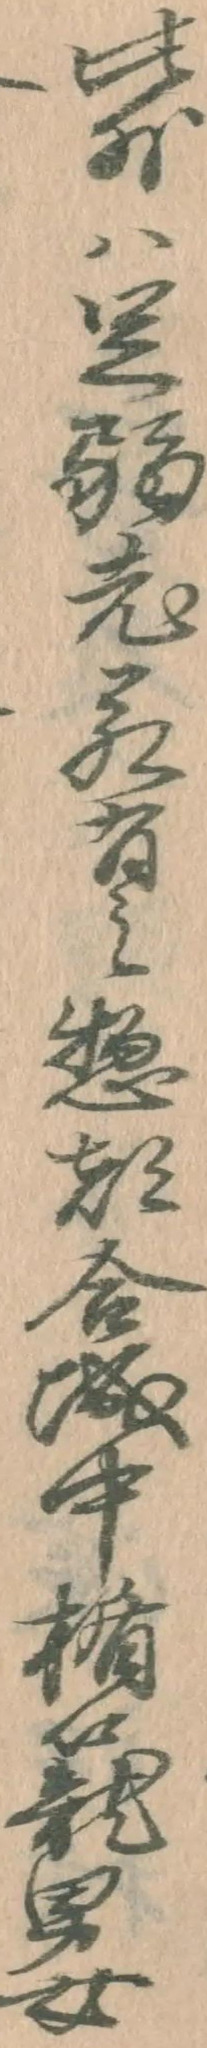此外は足弱老若有之惣都合城中楯籠男女
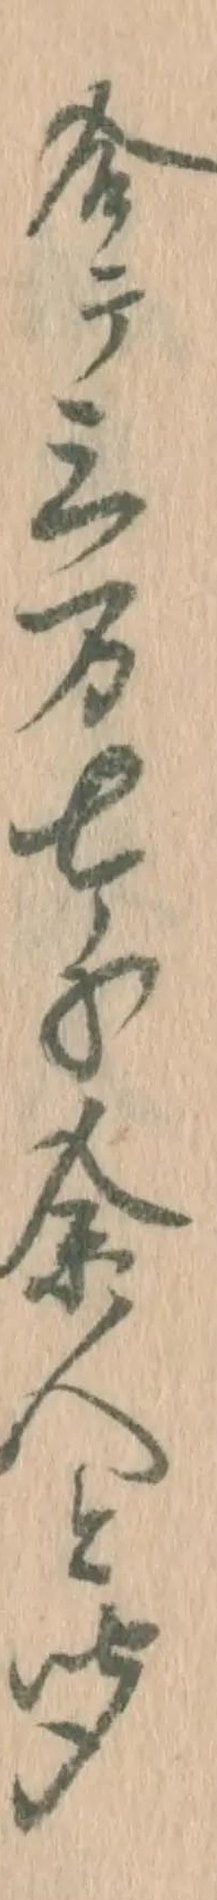合て三万七千余人と聞
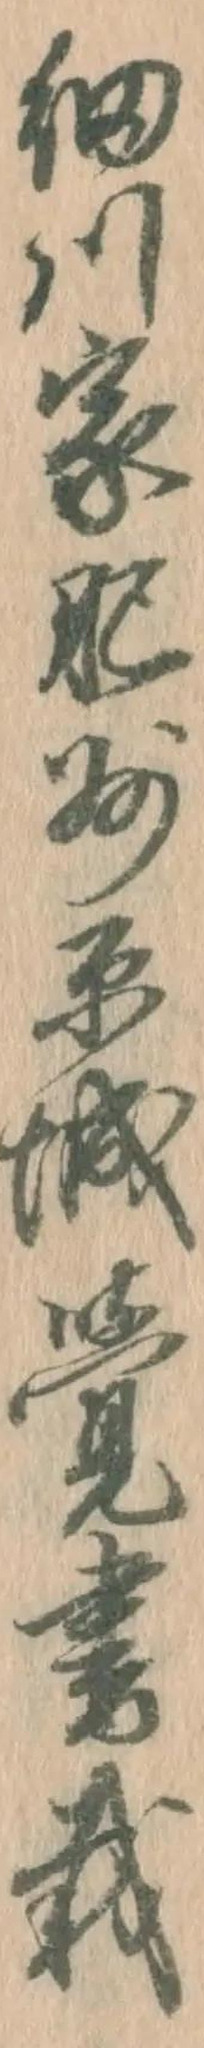細川家肥前原城覚書載
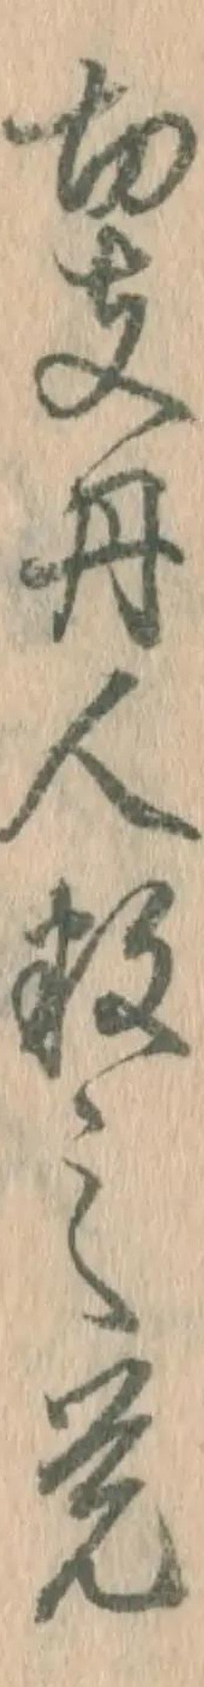切支丹人数之覚
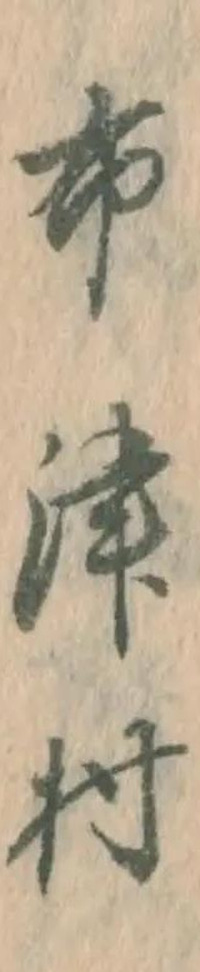布津村
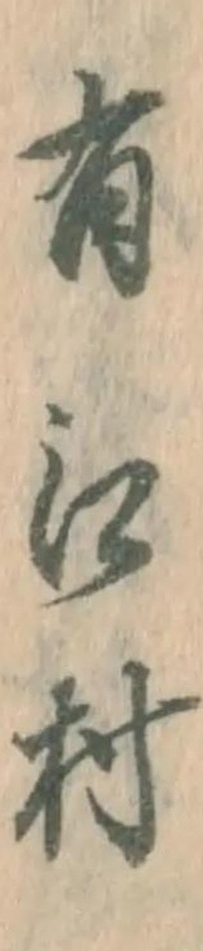有江村
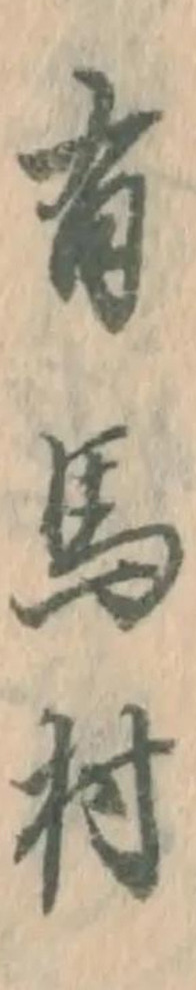有馬村

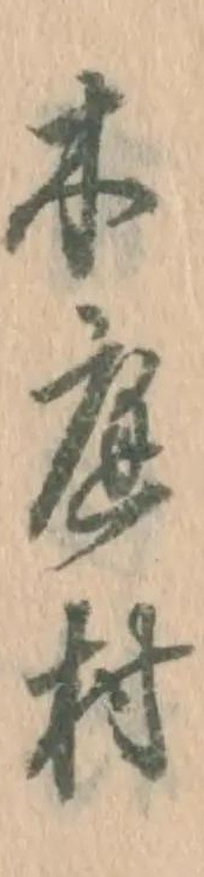木庭村
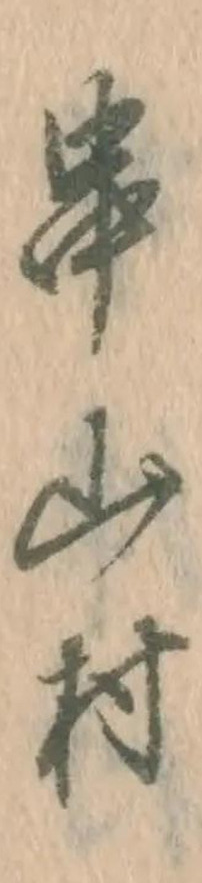串山村
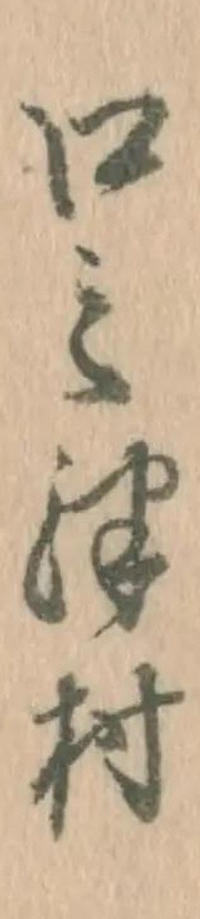口之津村
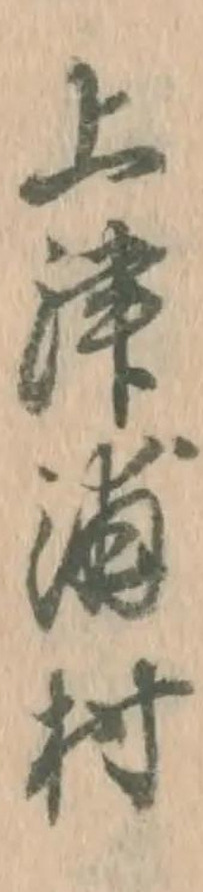上津浦村
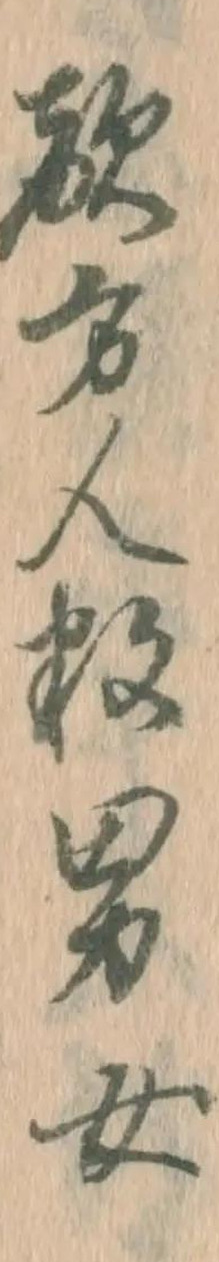敵方人数男女
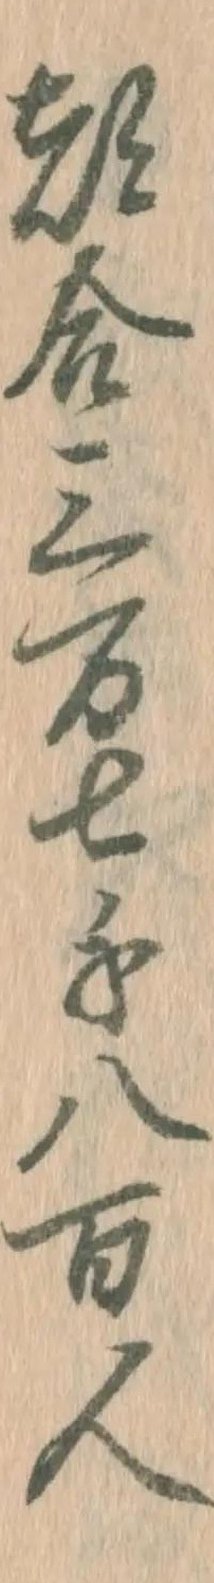都合三万七千八百人
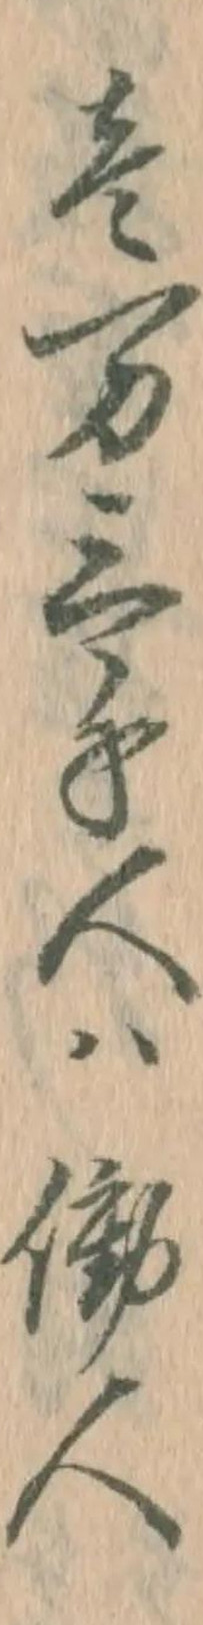壱万三千人は働人
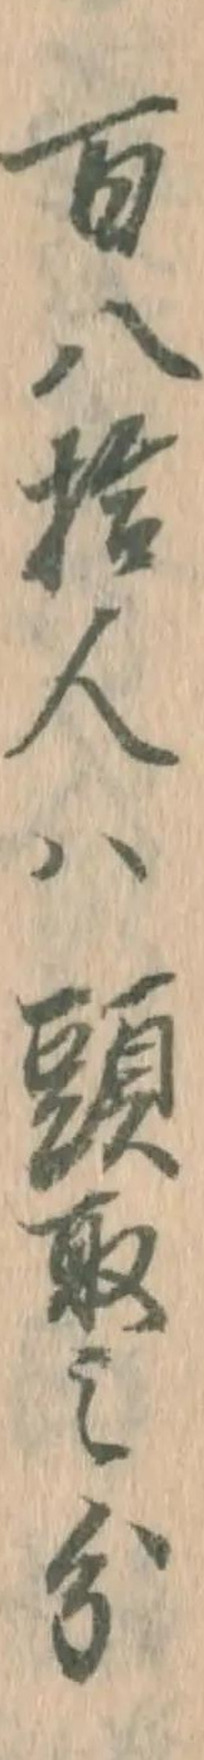百八拾人は頭取之分
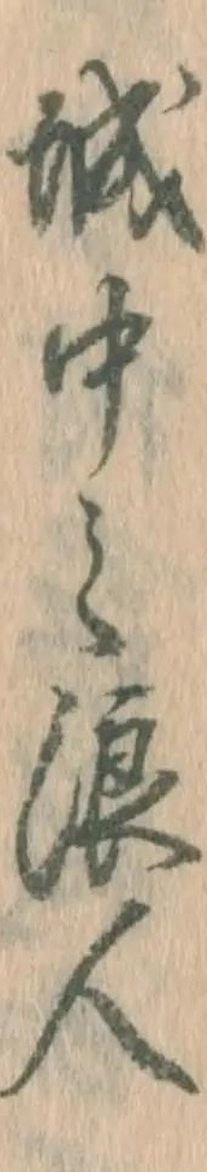城中之浪人
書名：切支丹御退治記 49巻. [4]
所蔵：国立国会図書館 National Diet Library, JAPAN
